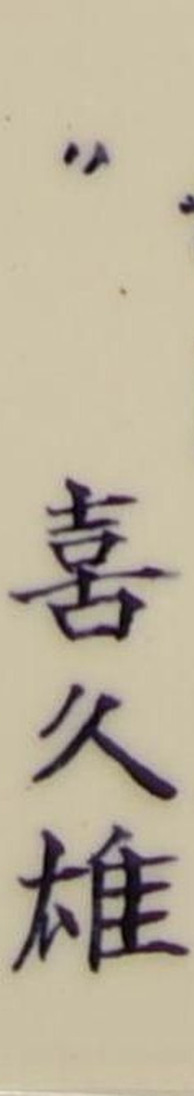喜久雄
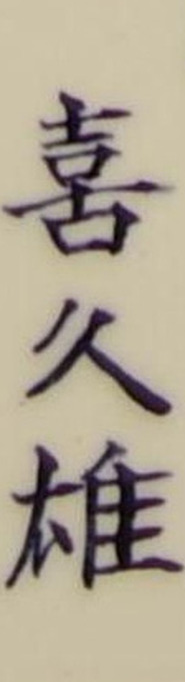喜久雄
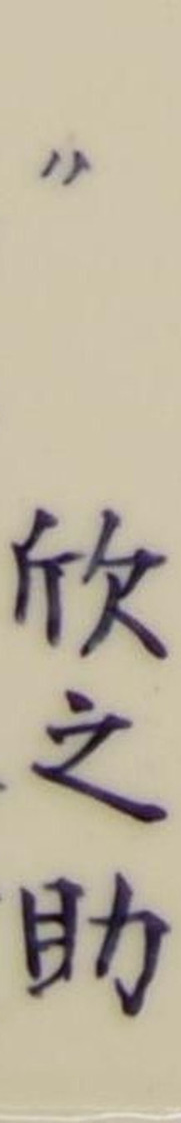欣之助
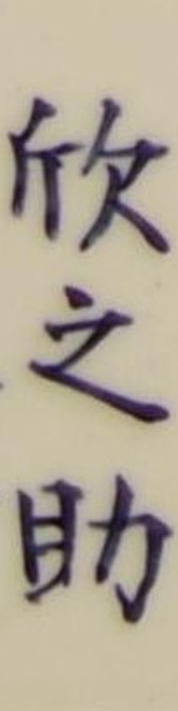欣之助
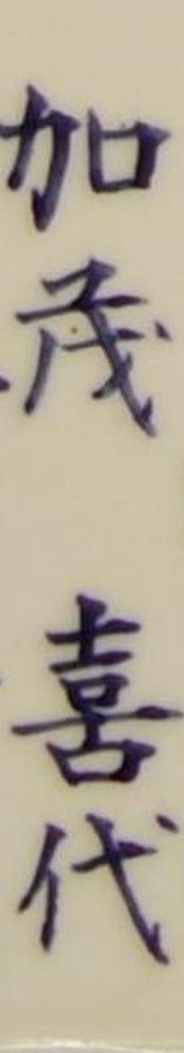加茂喜代
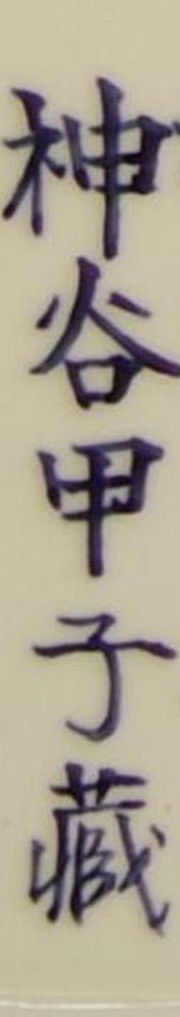神谷甲子蔵

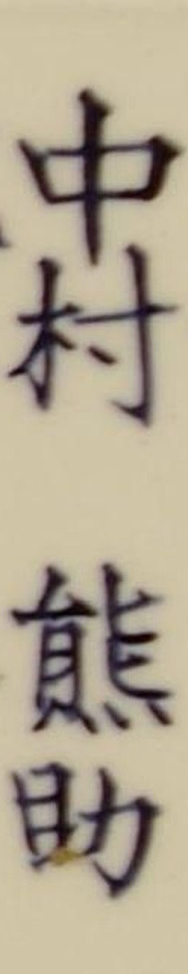中村熊助
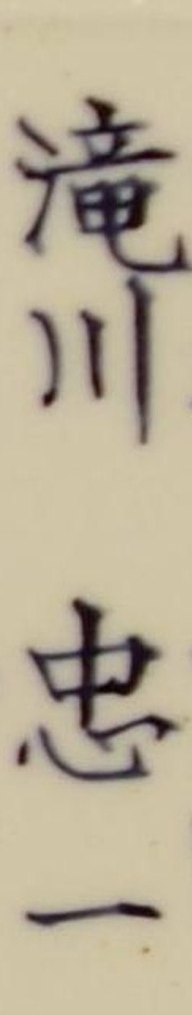滝川忠一
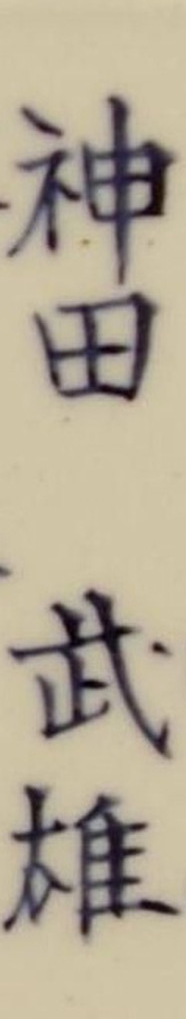神田武雄
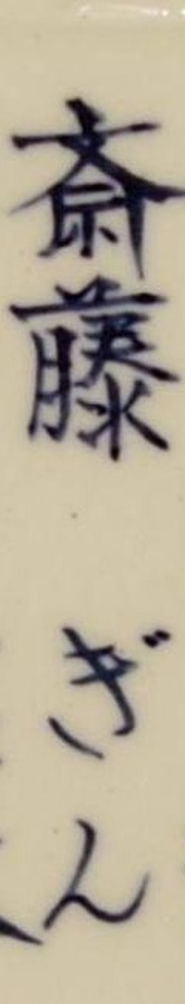斉藤ぎん
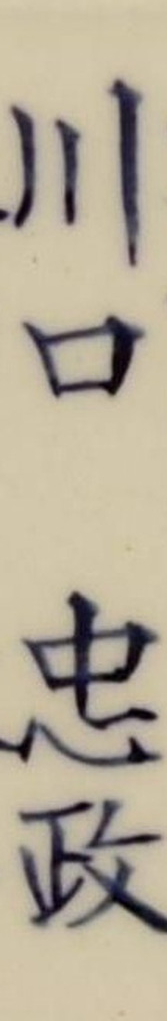川口忠政
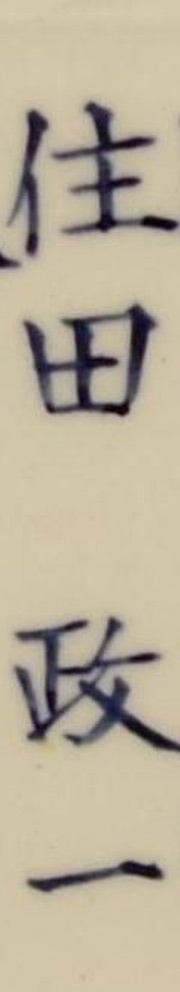住田政一
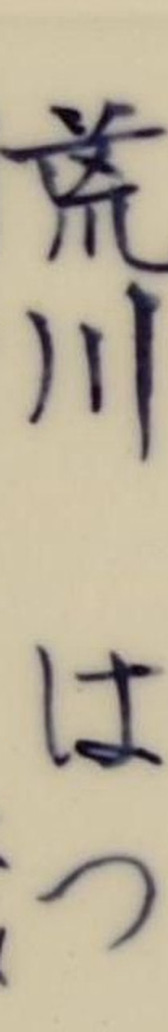荒川はつ
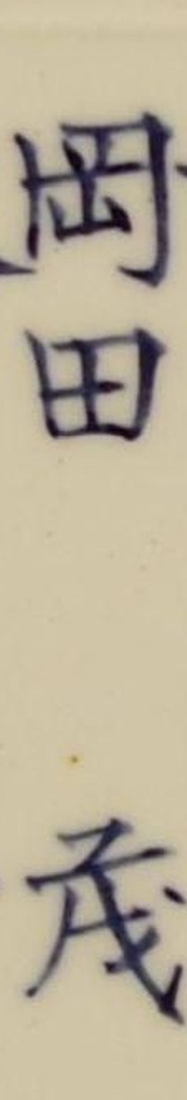岡田茂
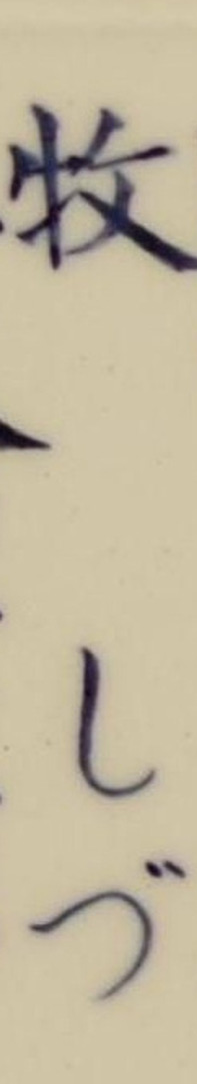牧しづ
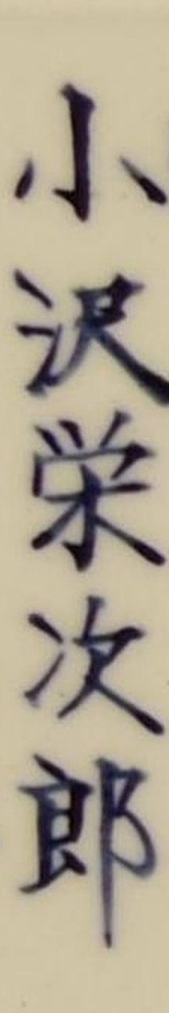小沢栄次郎
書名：E~L
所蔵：高野山金剛峯寺
